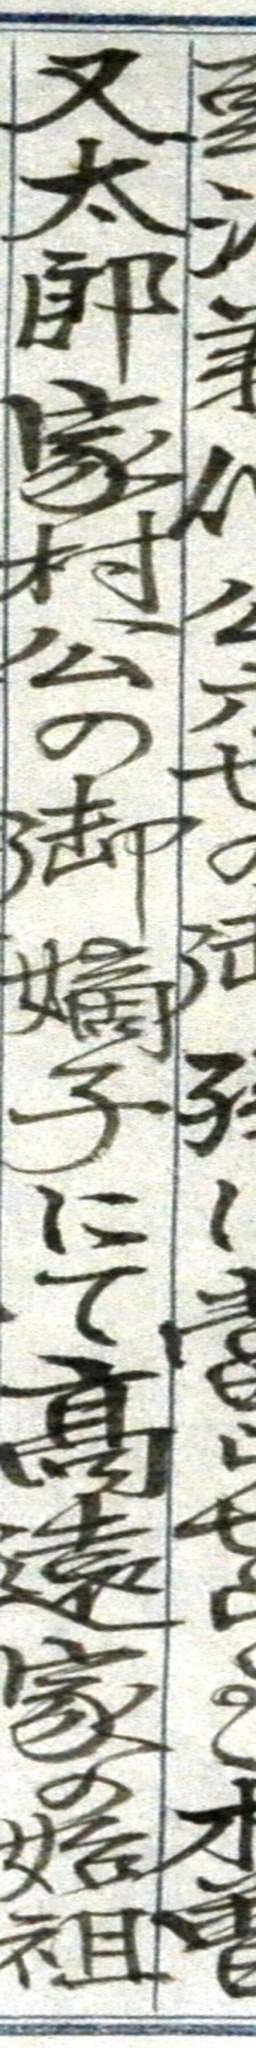又太郎家村公の御嫡子にて高遠家の始祖
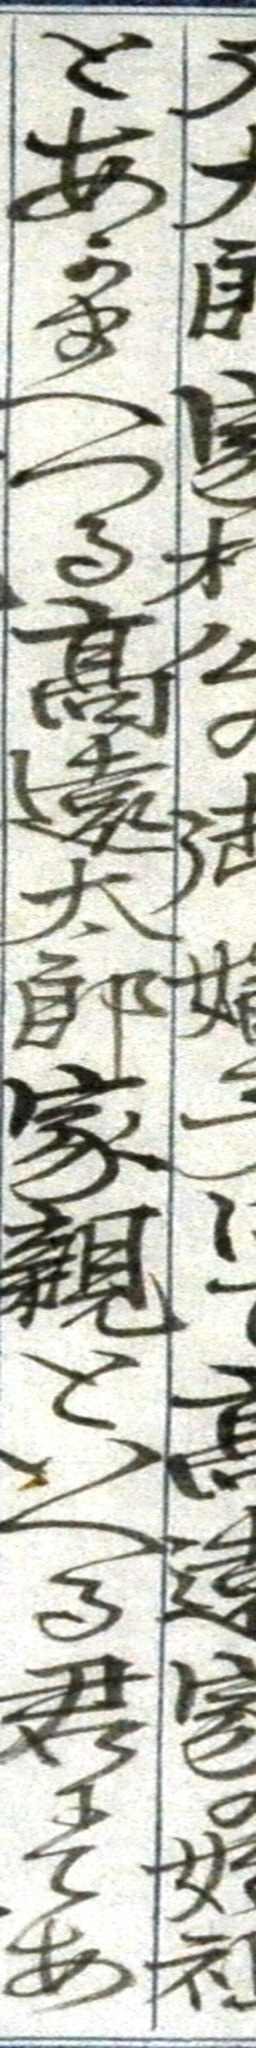とあかまへつる高遠太郎家親といへる君にてあ
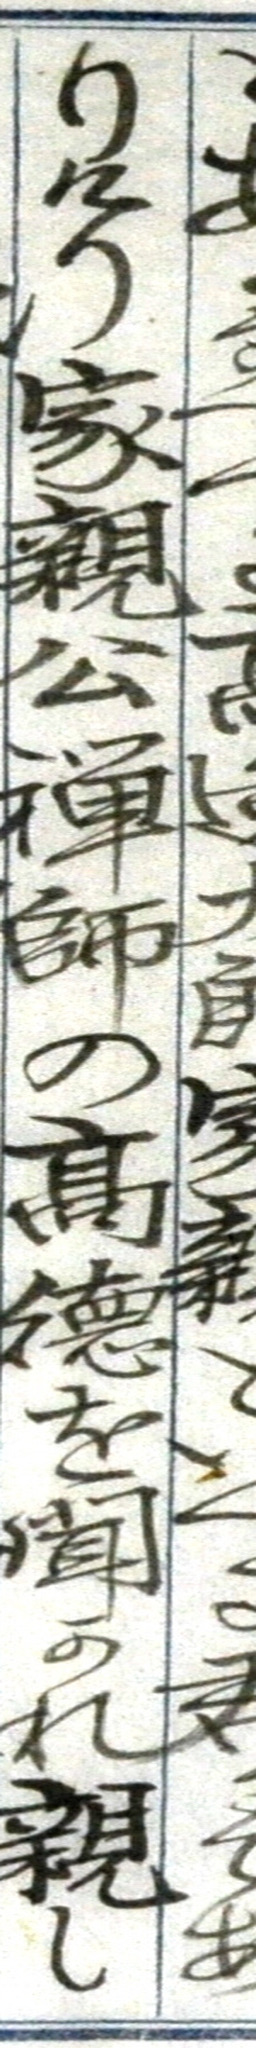りけり家親公禅師の高徳を聞かれ親し
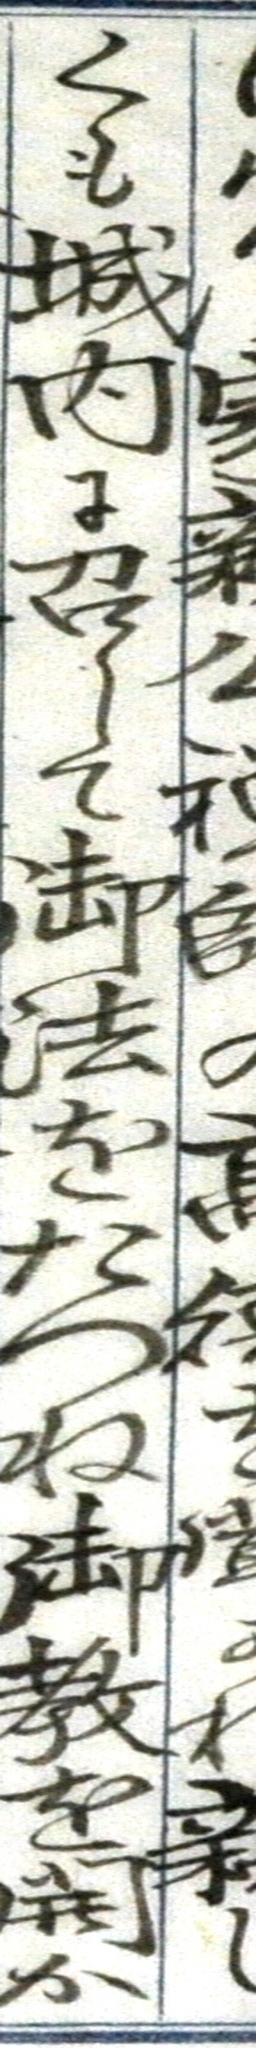くも城内に召して御法をたつね御教を聞か
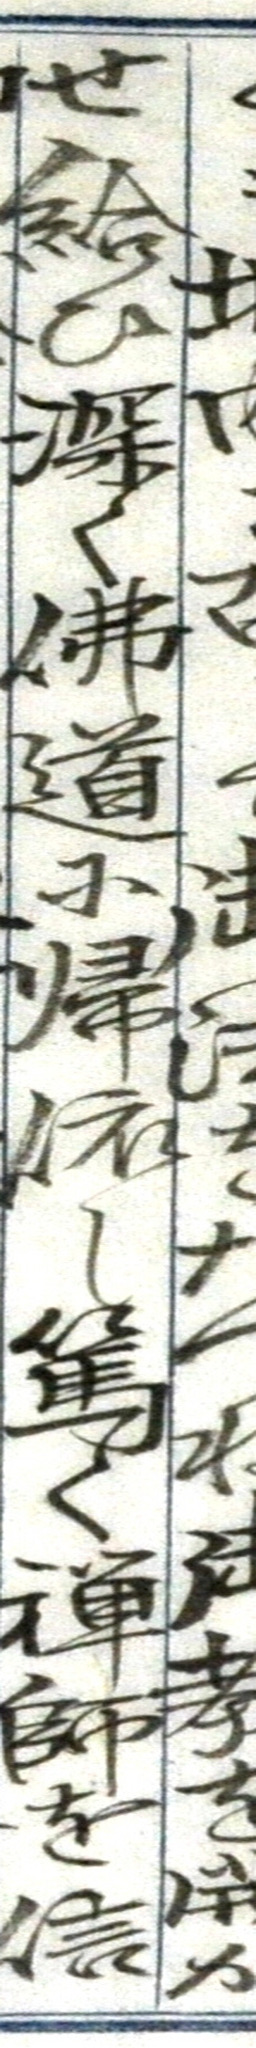せ給ひ深く仏道に帰依し篤く禅師を信
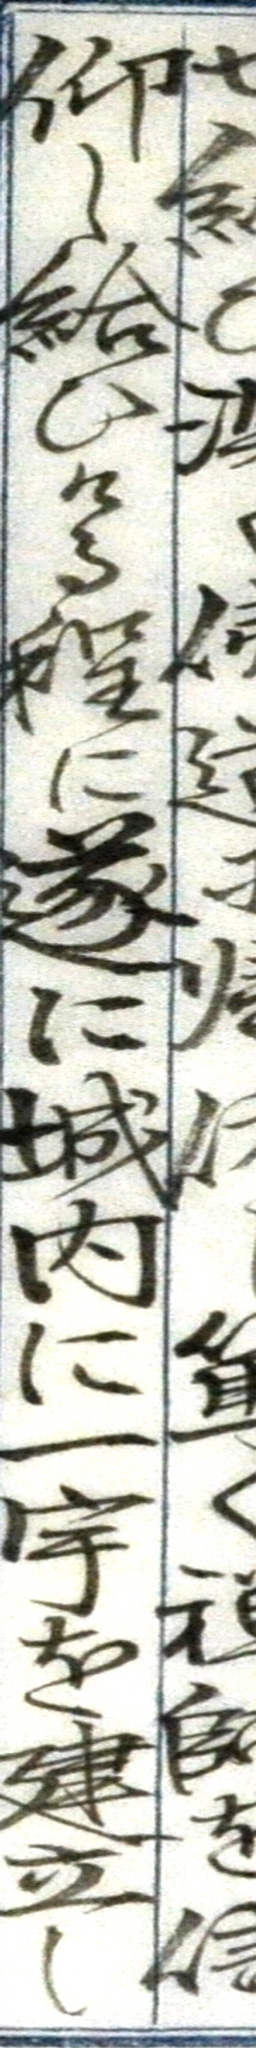仰し給ひける程に遂に城内に一宇を建立し
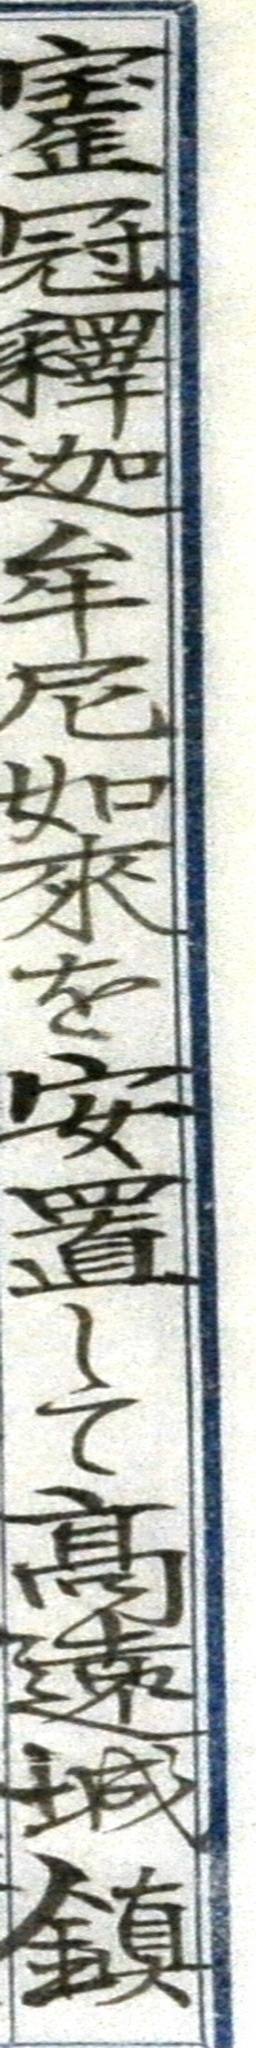宝冠釈迦牟尼如来を安置して高遠城鎮
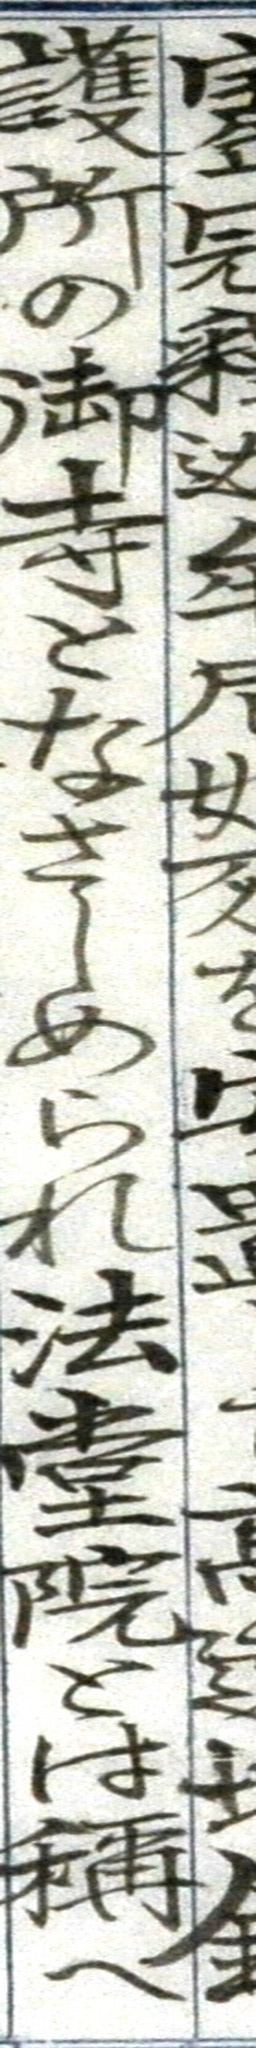護所の御寺となさしめられ法堂院とは称へ
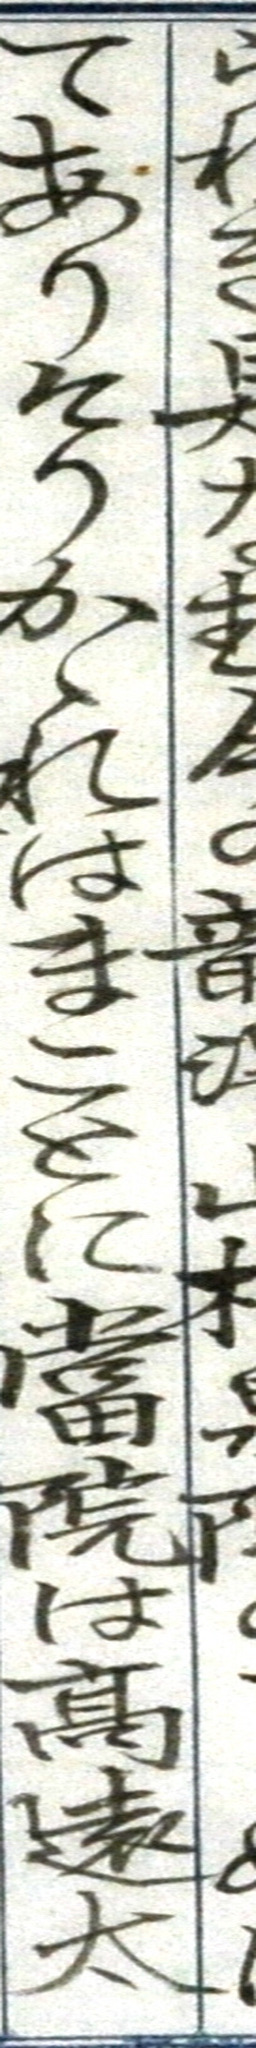てありけりかゝれはまことに当院は高遠太
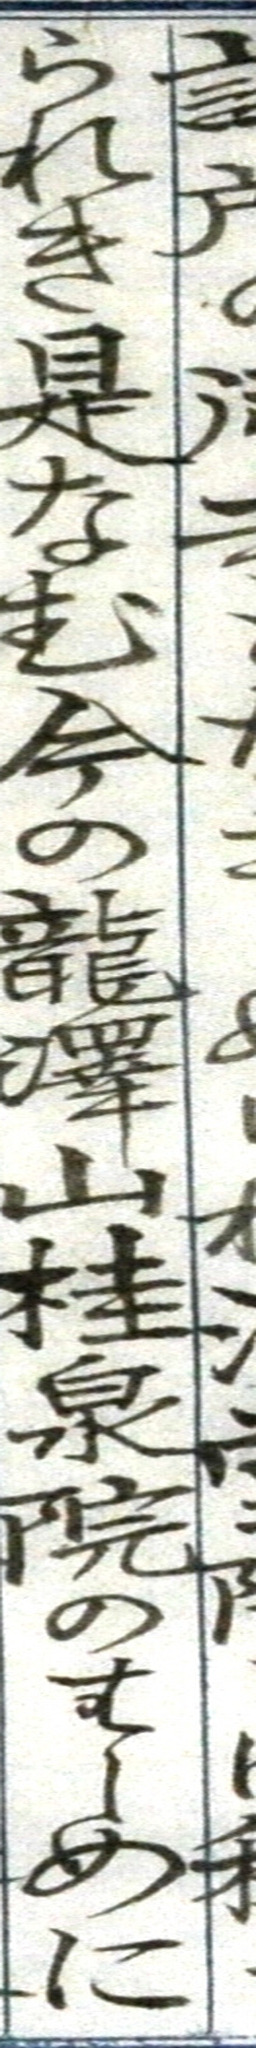られき是なむ今の龍澤山桂泉院のはしめに
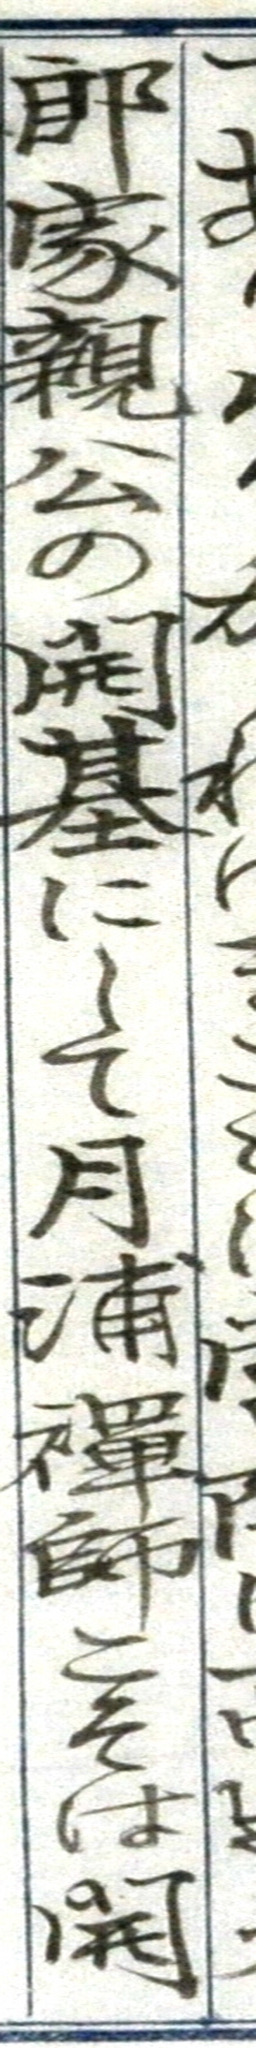郎家親公の開基にして月浦禅師こそは開
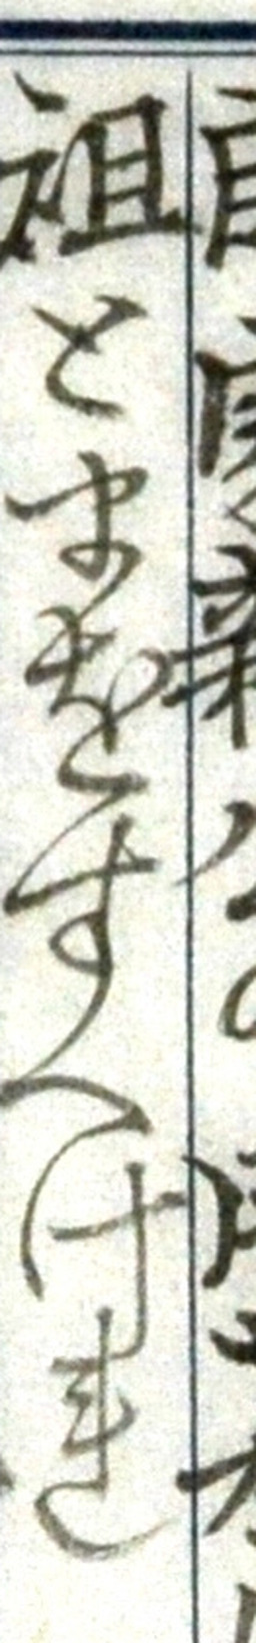祖とまをすへけれ
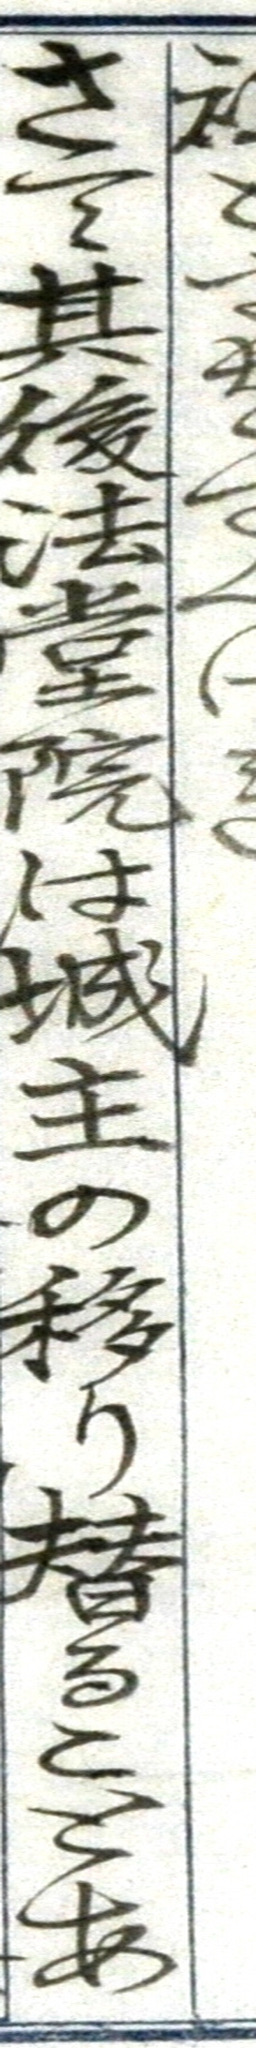さて其後法堂院は城主の移り替ることあ
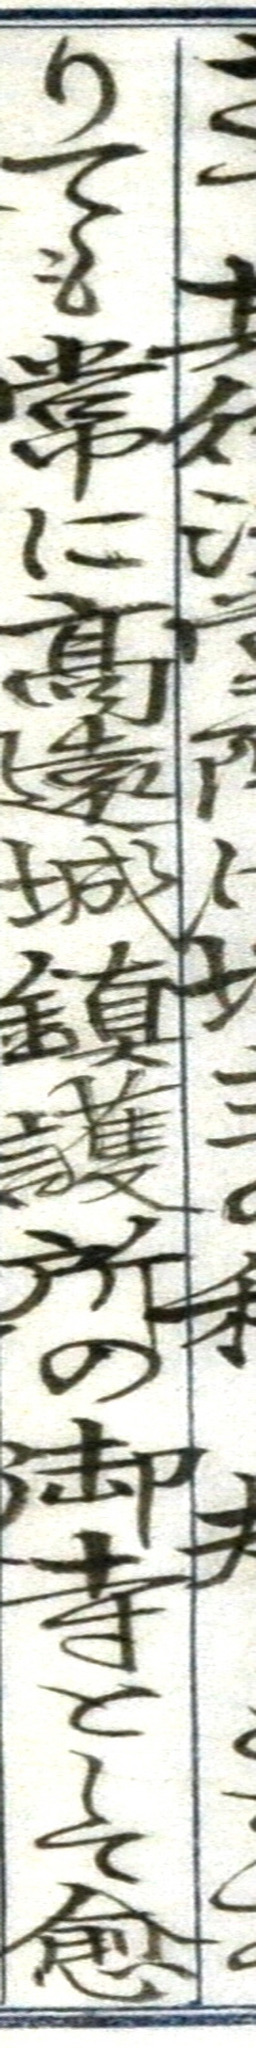りても常に高遠城鎮護所の御寺として愈
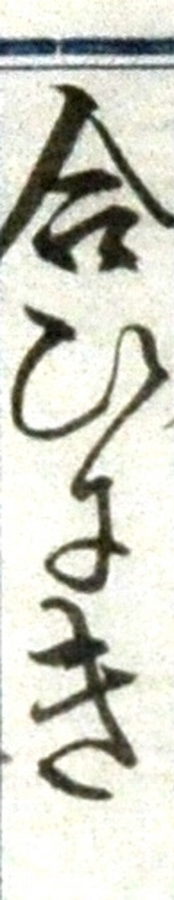合ひにき
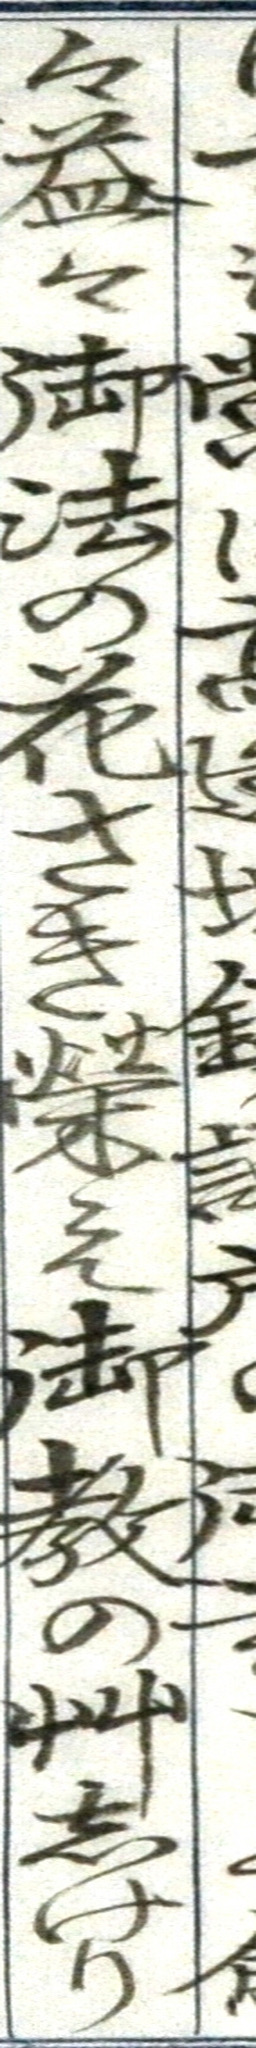々益々御法の花さき栄え御教の草しけり
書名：桂泉院・樹林寺・東光寺縁起書、蓮華寺由来書、付夕顔観音記
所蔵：伊那市立高遠町図書館・合同会社AMANE
